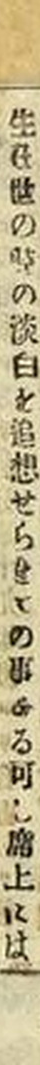生在世の時の淡白を追想せられての事なる可し席上には
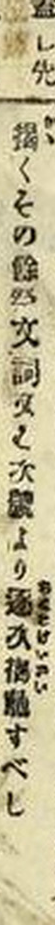掲くその餘祭文詞文は次號より逐次掲すべし

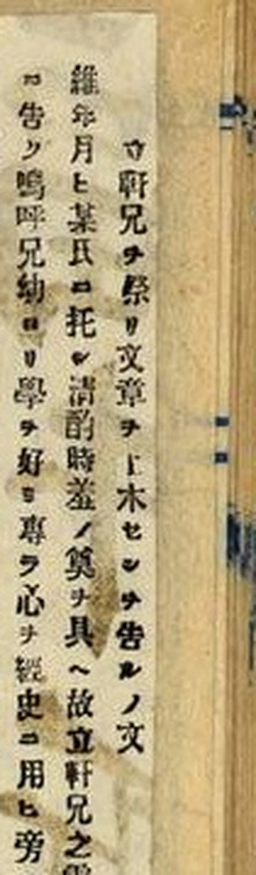立軒兄ヲ祭リ文章ヲ上木センヲ告ルノ文
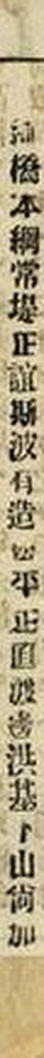橋本綱常堤正誼斯波有造田平正直渡邊洪基卜山尚加
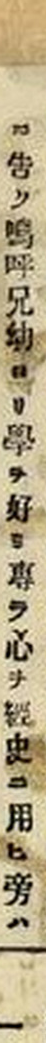ニ告ク嗚呼兄幼ヨリ學ヲ好ミ專ラ心ヲ經史ニ用ヒ傍ハ
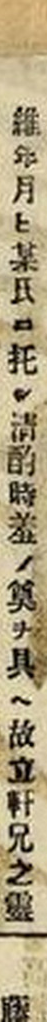維年月日某氏ニ托シ清酌時羞ノ奠ヲ具へ故立軒兄之靈
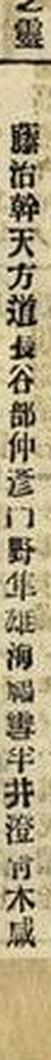藤治幹天方道長谷部仲彦門野隼雄海福半井澄青木咸
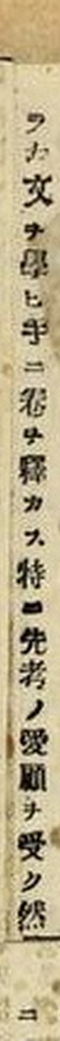ラ文ヲ學ヒ手ニ巻ヲ釋カス特ニ先考ノ愛顧ヲ受ク然
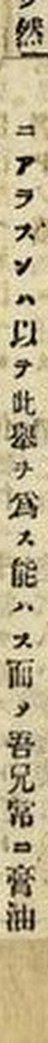ニアラスンハ以テ此擧ヲ爲ス能ハス而シテ吾兄常ニ膏油
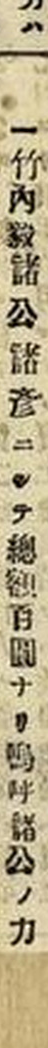一竹内毅諸公諸彦ニシテ總額百圓ナリ嗚呼諸公ノ力
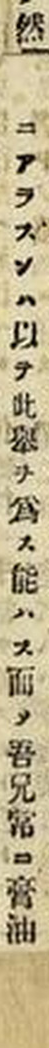ニアラスンハ以テ此擧ヲ爲ス能ハス而シテ吾兄常ニ膏油
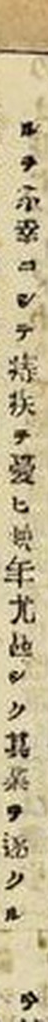ルヲ不幸ニシテ痔疾ヲ憂ヒ年尤甚シク其業ヲ遂クル
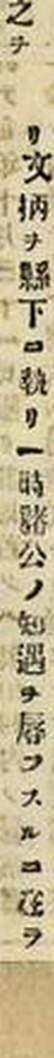リ文柄ヲ縣下ニ執リ一時諸公ノ知遇ヲ辱フスルニ在ラ
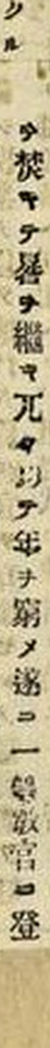ヲ焚キテ暑ヲ繼キ兀々以テ年ヲ窮メ遂ニ一等教官ニ登
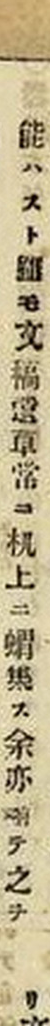能ハスト雖モ文稿遺草常ニ机上ニ蝟集ス余亦テ之ヲ
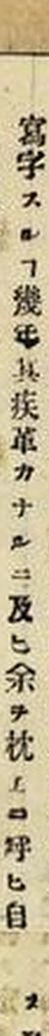寫字スルヿ幾年其疾革カナシニ及ヒ余ヲ枕上ニ呼ヒ自
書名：温古集 四巻
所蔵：福井県文書館 Fukui Prefectural Archives
